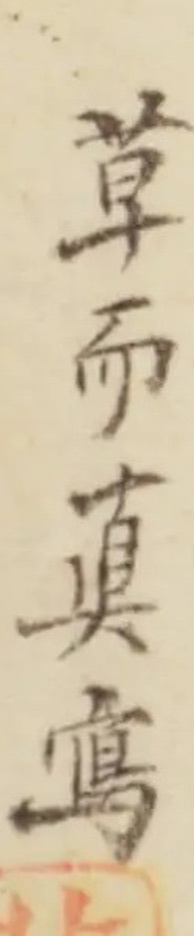草而真寫

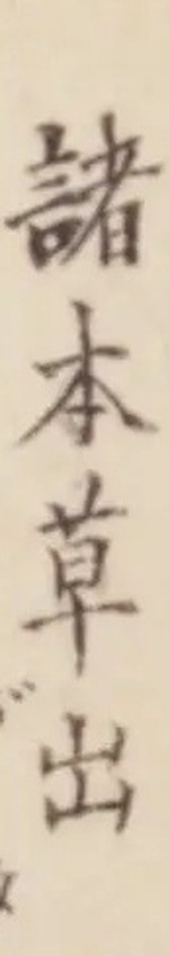諸本草出
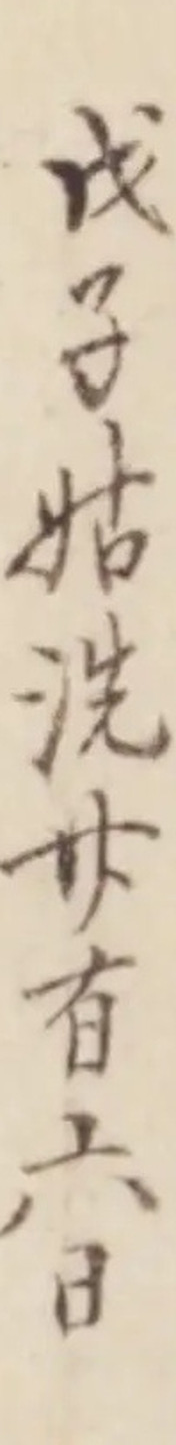戊子姑洗廿有六日
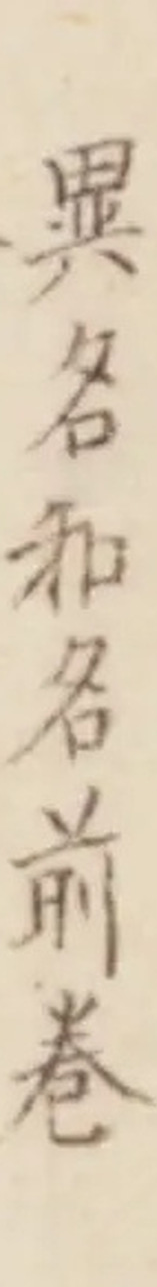花王異名和名前巻
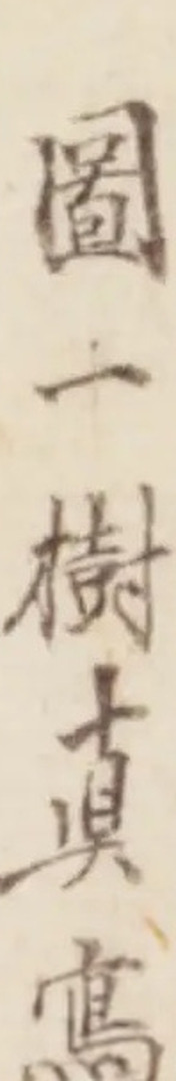圖一樹真寫

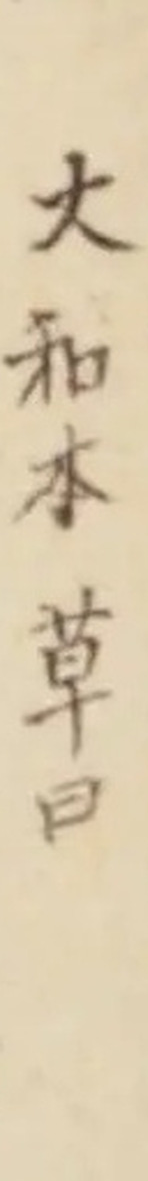大和本草曰
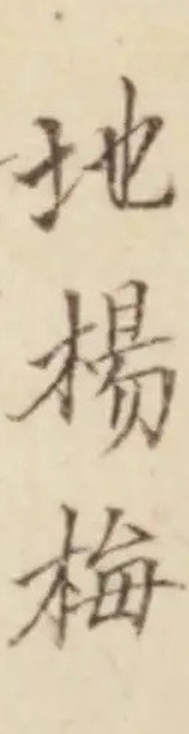地楊梅
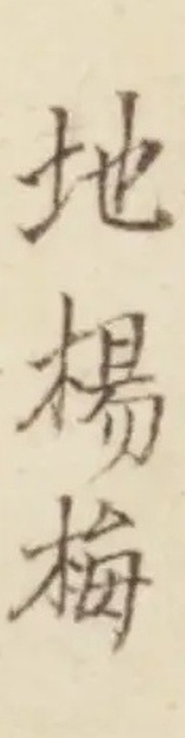地楊梅
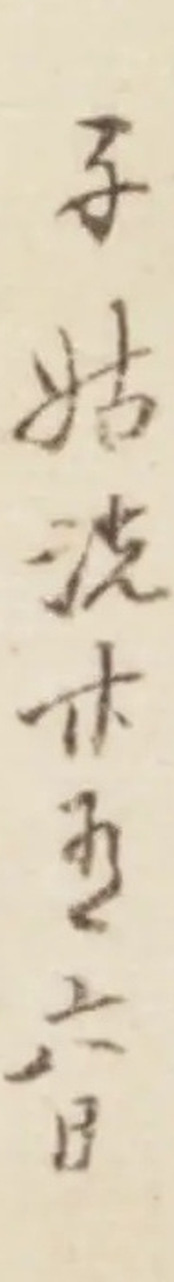子姑洗廿有六日
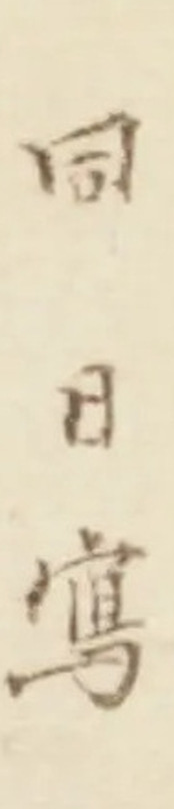同日寫

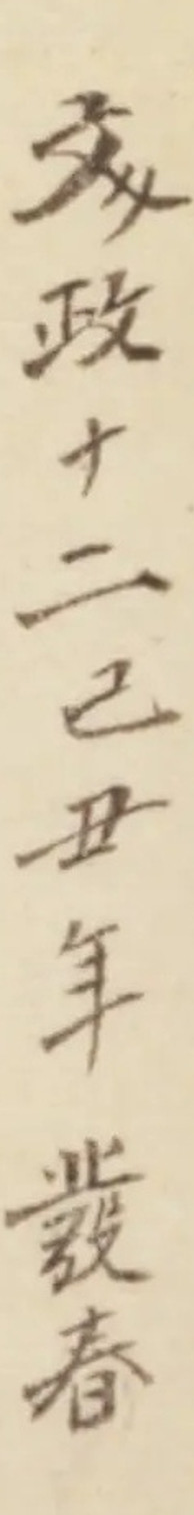文政十二年己丑發春
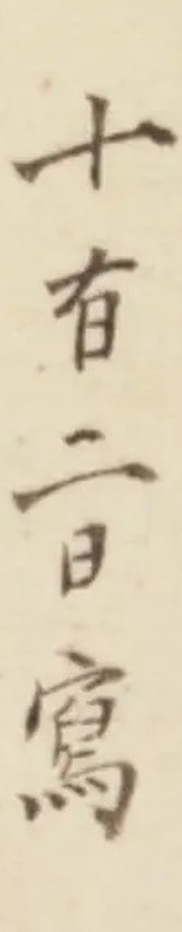十有二日寫
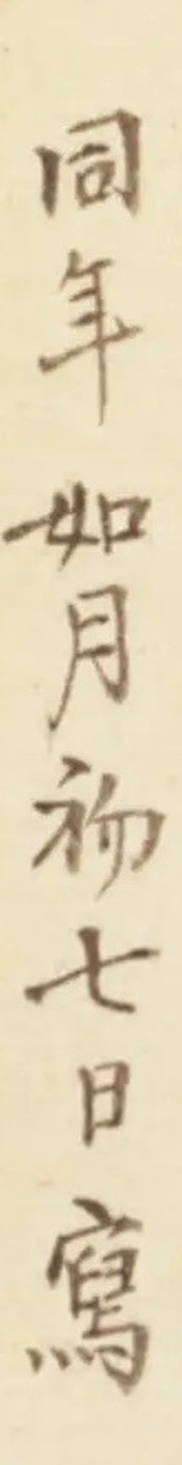同年如月初七日寫

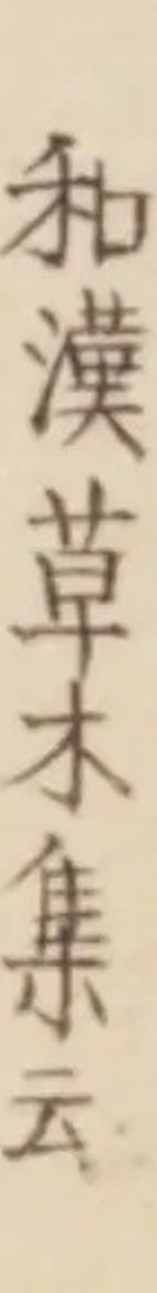和漢草木集云
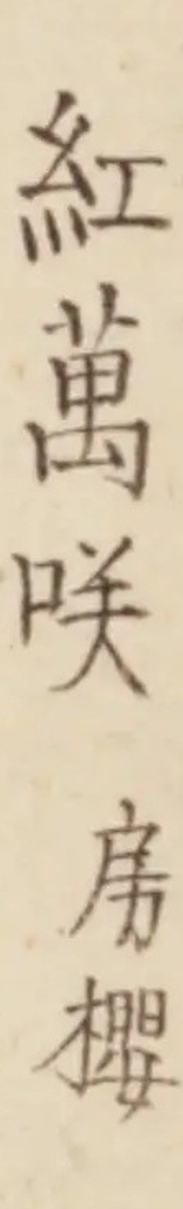紅萬咲房櫻
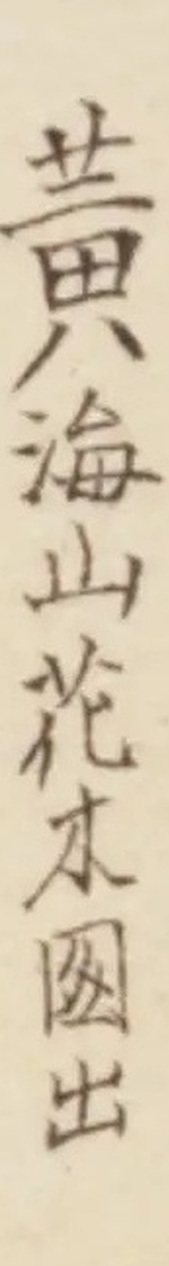黄海山花木園出
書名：梅園草木花譜春之部. 3
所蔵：国立国会図書館 National Diet Library, JAPAN
